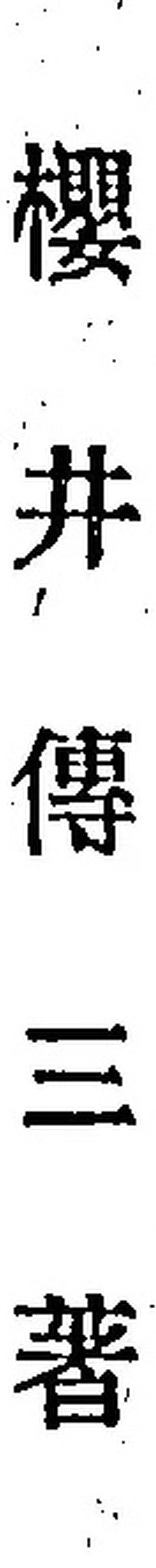桜井伝三著
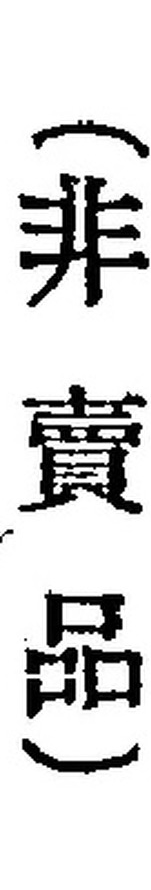(非売品)
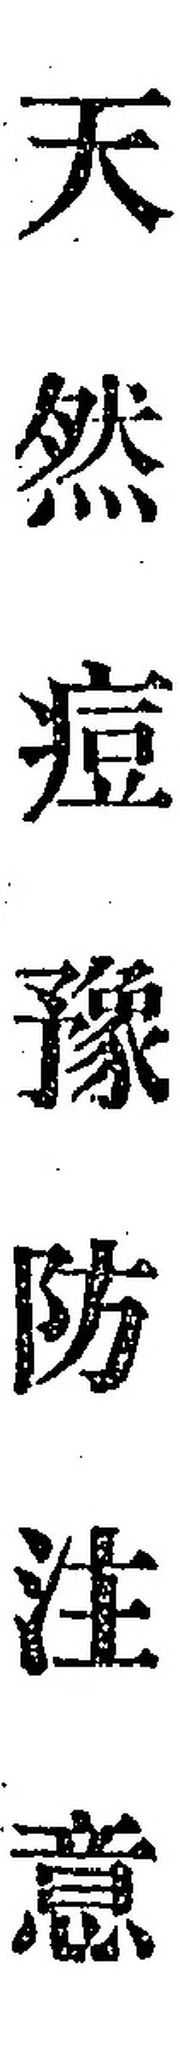天然痘予防注意

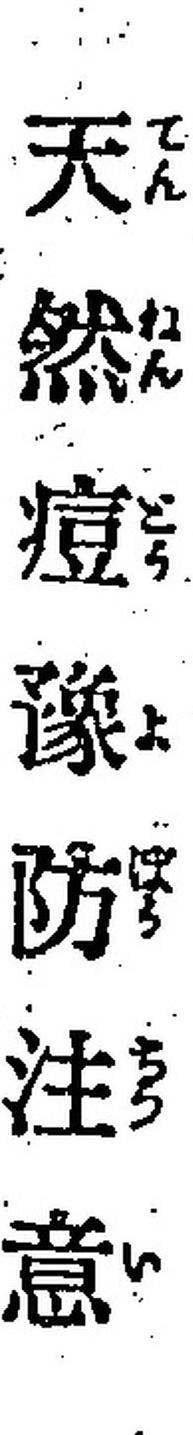天然痘予防注意
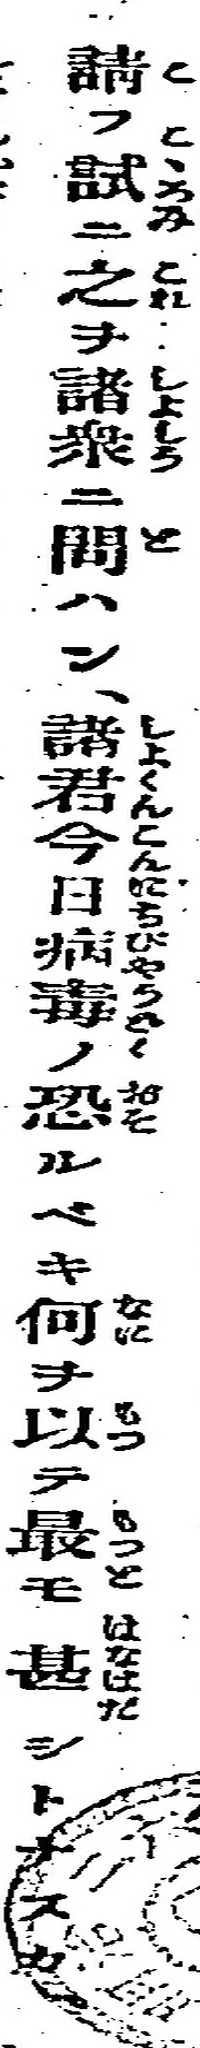請フ試ニ之ヲ諸衆ニ問ハン、諸君今日病毒ノ恐ルベキ何ヲ以テ最モ甚シトナスカ、
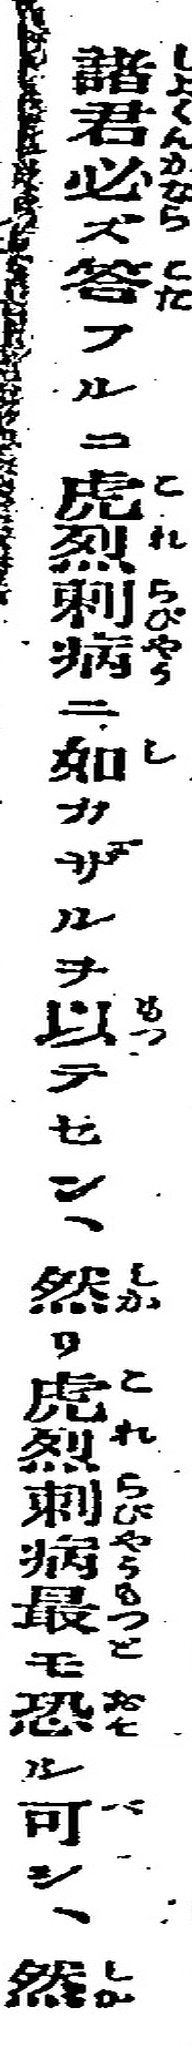諸君必ズ答フルニ虎烈刺病ニ如カザルヲ以テセン、然リ虎烈刺病最モ恐ル可シ、然
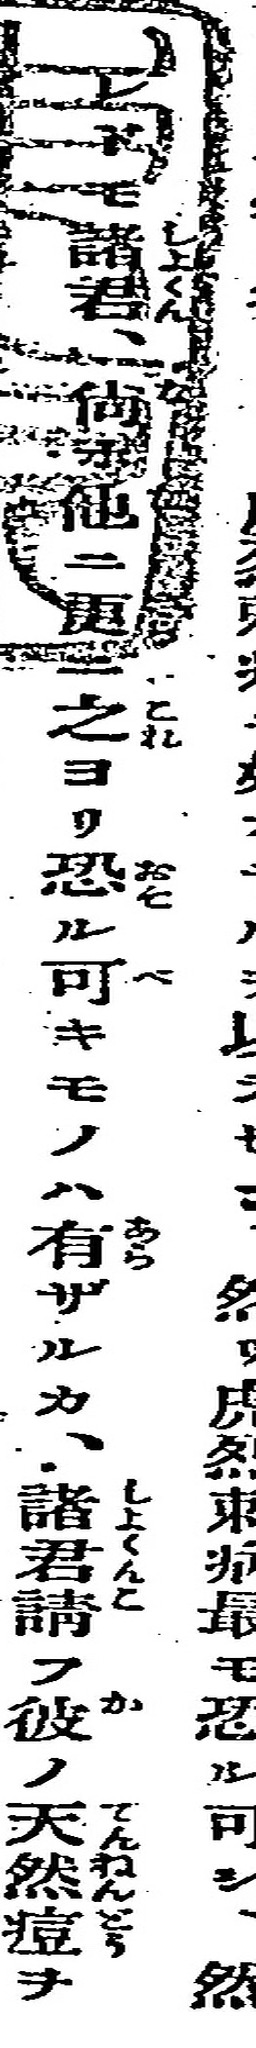レドモ諸君、尚ホ他ニ更ニ之ヨリ恐ル可キモノハ有ザルカ、諸君請フ彼ノ天然痘ヲ
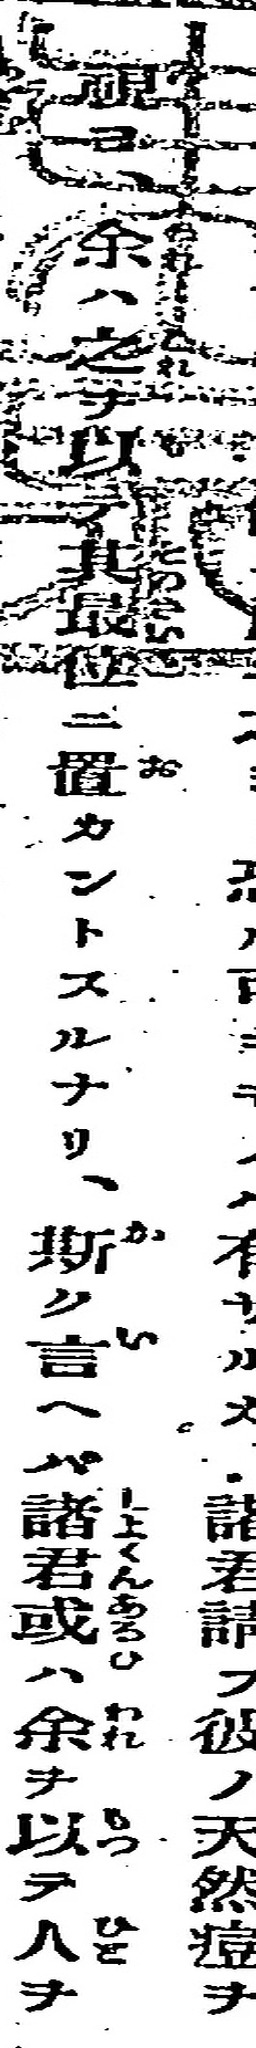視ヨ、余ハ之ヲ以テ其最位ニ置カントスルナリ、斯ク言ヘバ諸君或ハ余ヲ以テ人ヲ
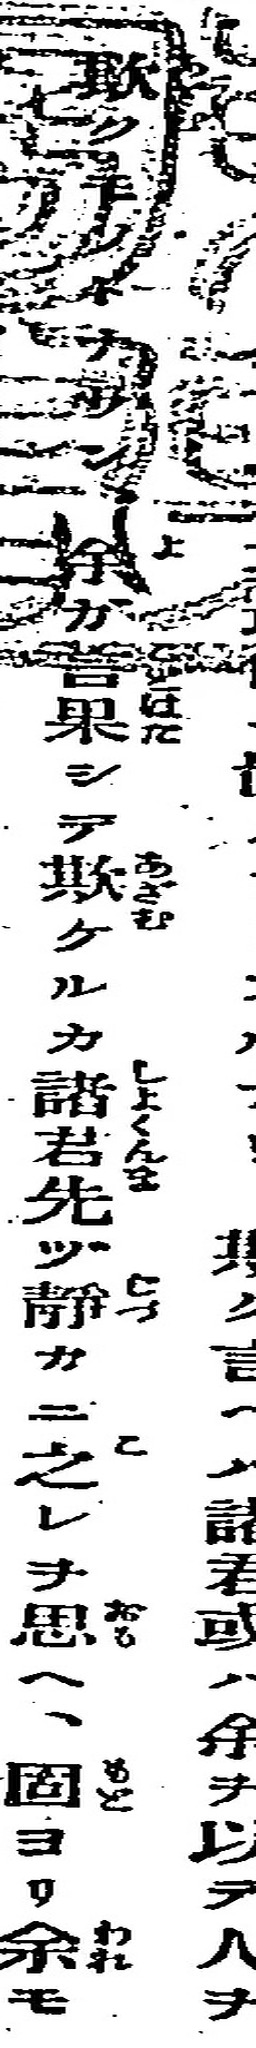欺クモノトナラン、余ガ言果シテ欺ケルカ諸君先ヅ静カニ之レヲ思ヘ、固ヨリ余モ
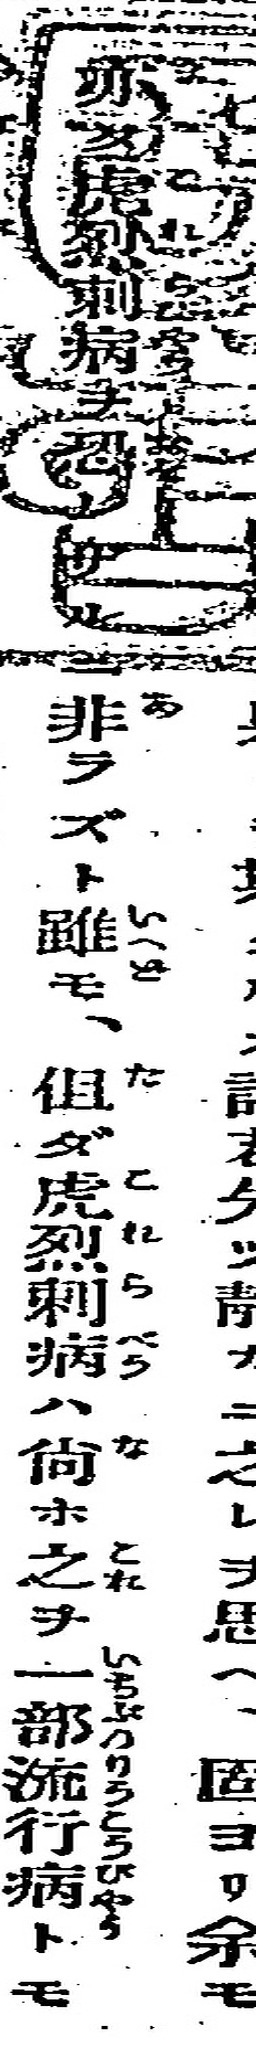亦タ虎烈刺病ヲ恐レザルニ非ラズト雖モ、伹ダ虎烈刺病ハ尚ホ之ヲ一部流行病トモ
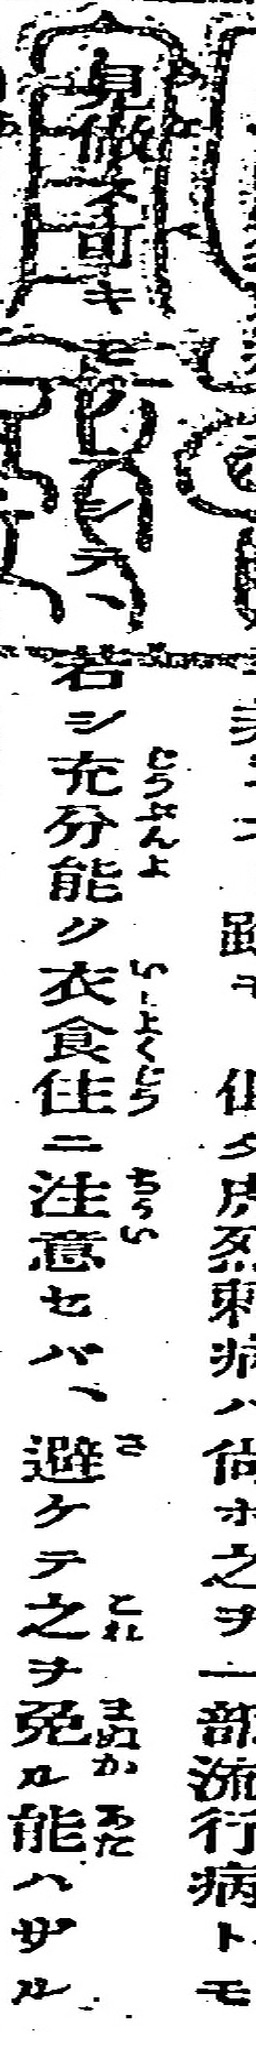見做ス可キモノニシテ、若シ充分能ク衣食住ニ注意セバ、避ケテ之ヲ免ル能ハザル
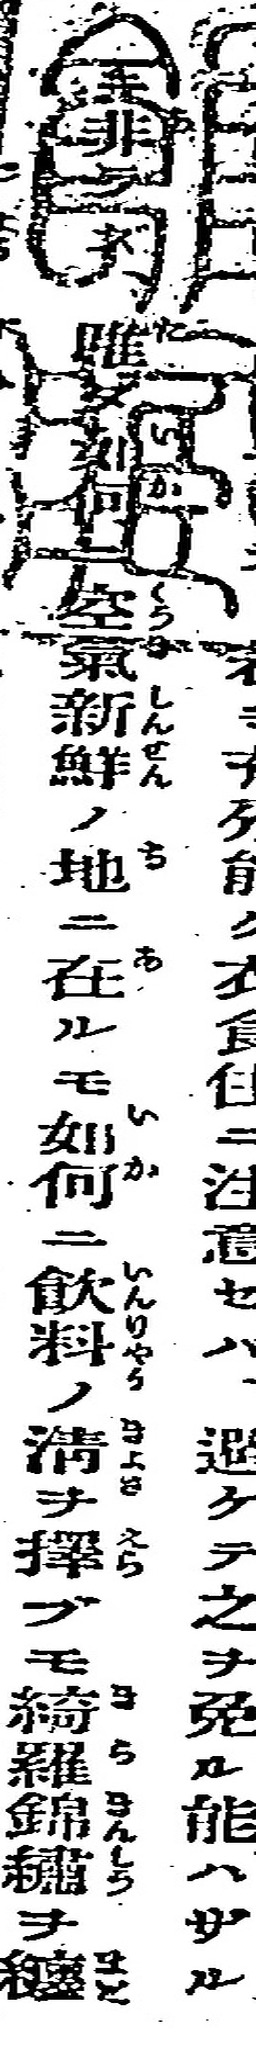ニ非ラズ、唯ダ如何ニ空気新鮮ノ地ニ在ルモ如何ニ飲料ノ清ヲ択ブモ綺羅錦繡ヲ纏
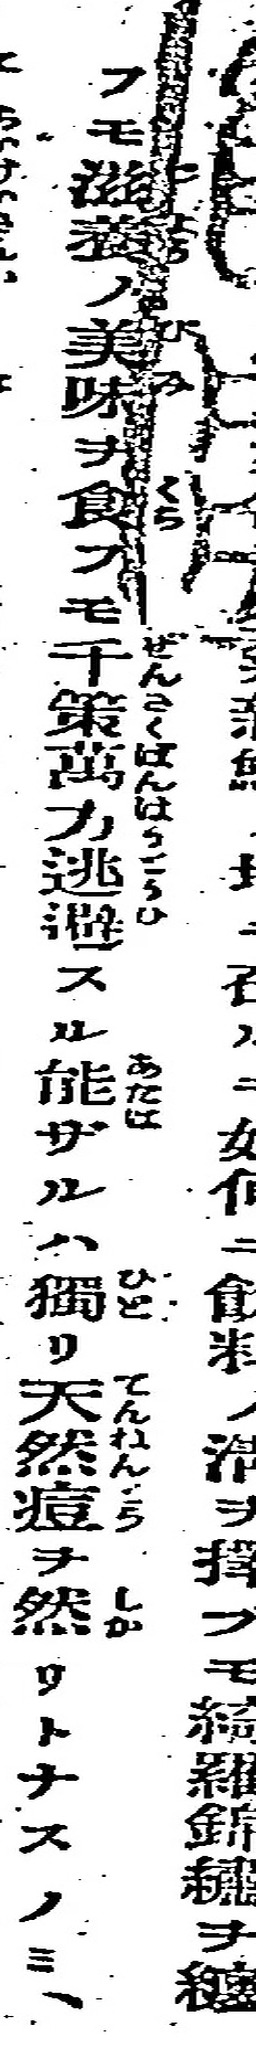フモ滋養ノ美味ヲ食フモ千策万方逃避スル能ザルハ独リ天然痘ヲ然リトナスノミ、
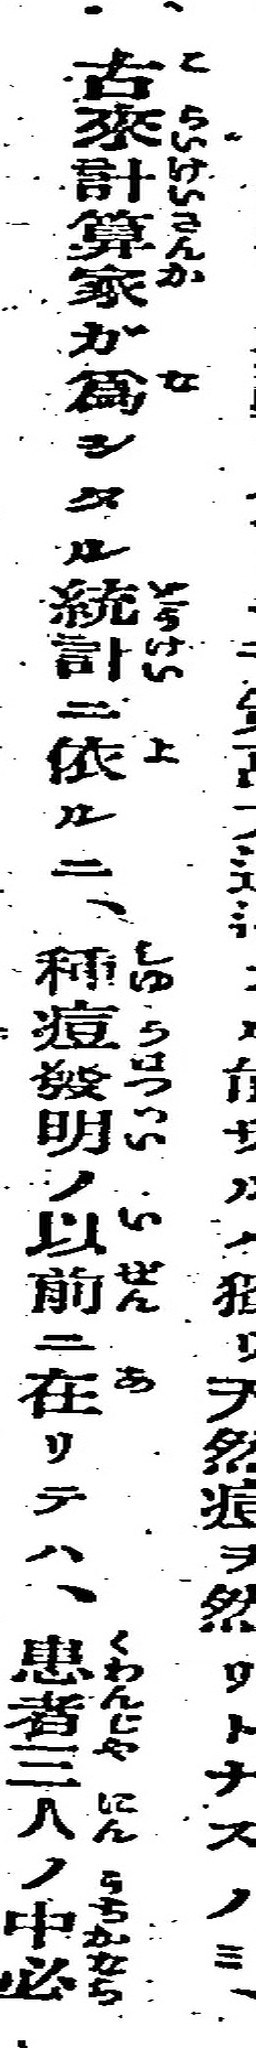古来計算家ガ為シタル統計ニ依ルニ、種痘発明ノ以前ニ在リテハ、患者三人ノ中必

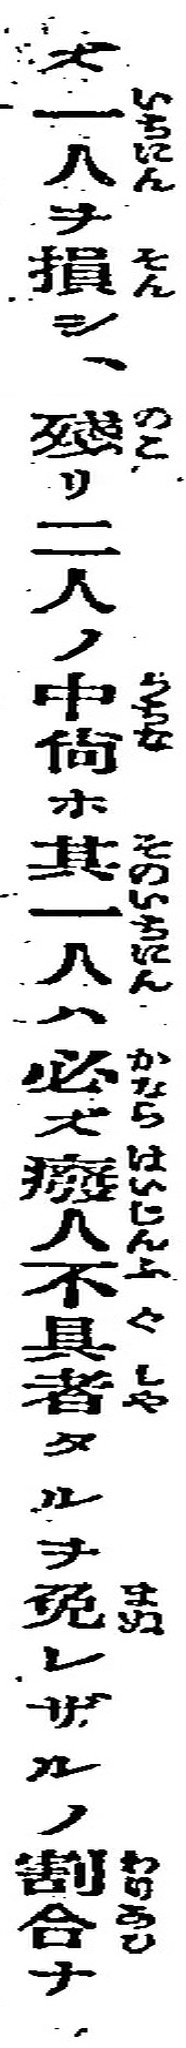ズ一人ヲ損シ、残リ二人ノ中尚ホ其一人ハ必ズ廃人不具者タルヲ免レザルノ割合ナ
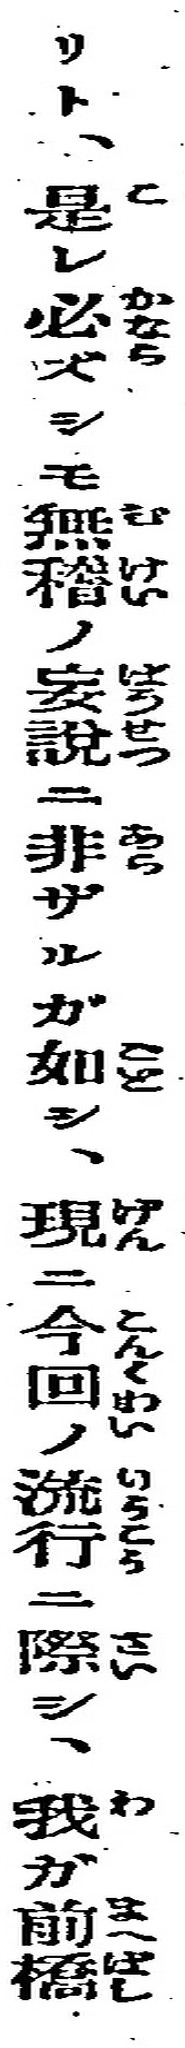リト、是レ必ズシモ無稽ノ妄説ニ非ザルガ如シ、現ニ今回ノ流行ニ際シ、我ガ前橋
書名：天然痘予防注意兼種痘者之注意
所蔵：国立国会図書館 National Diet Library, JAPAN
